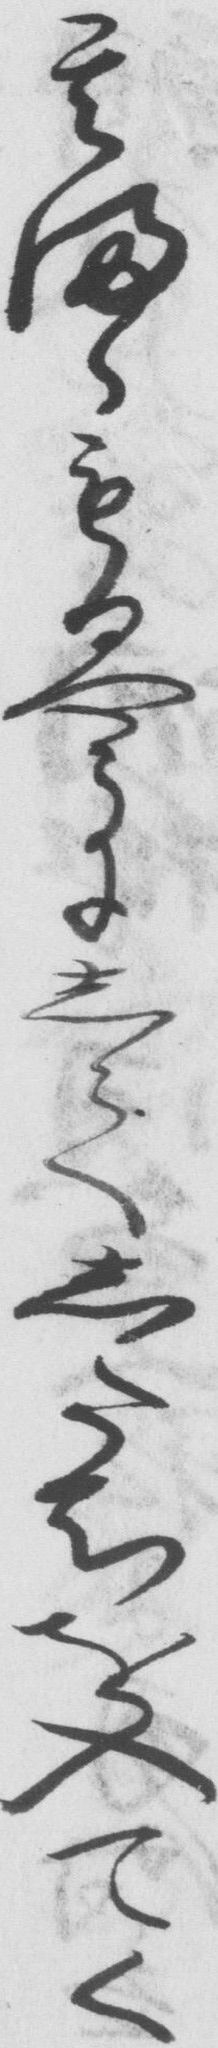其まゝもるやうにしてしたちを入てく
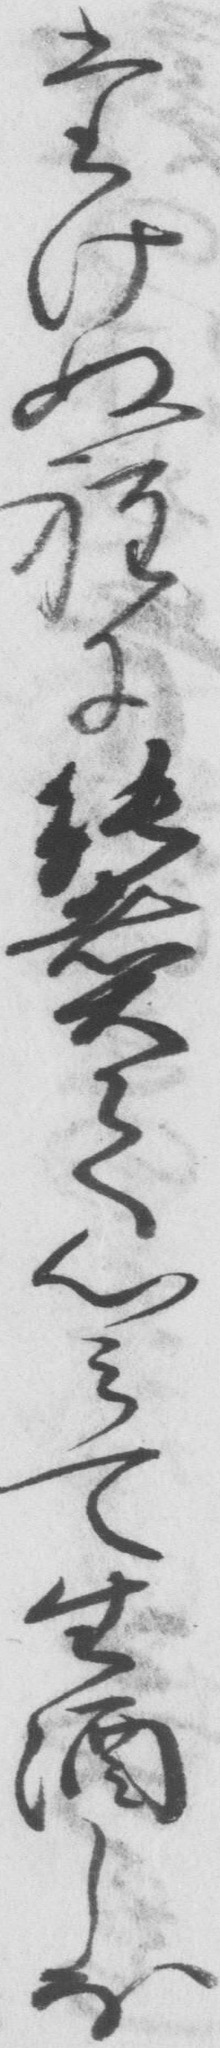たけぬ程に能煮て心みて生酒しほ
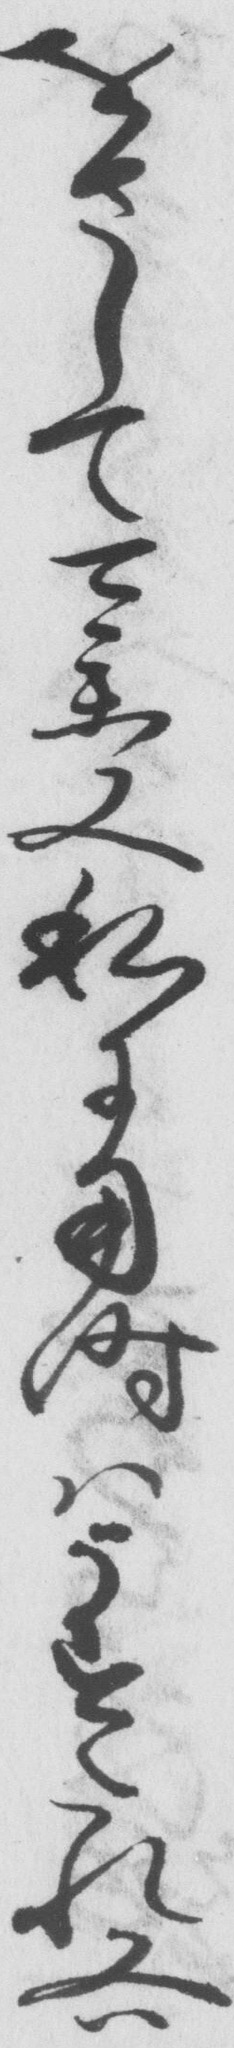をさして可参又私の用時はうすたれ又は
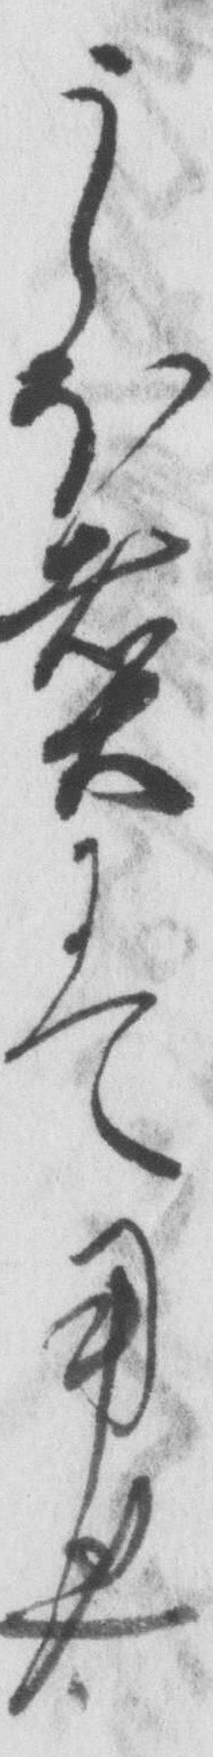うしほ煮にて用也
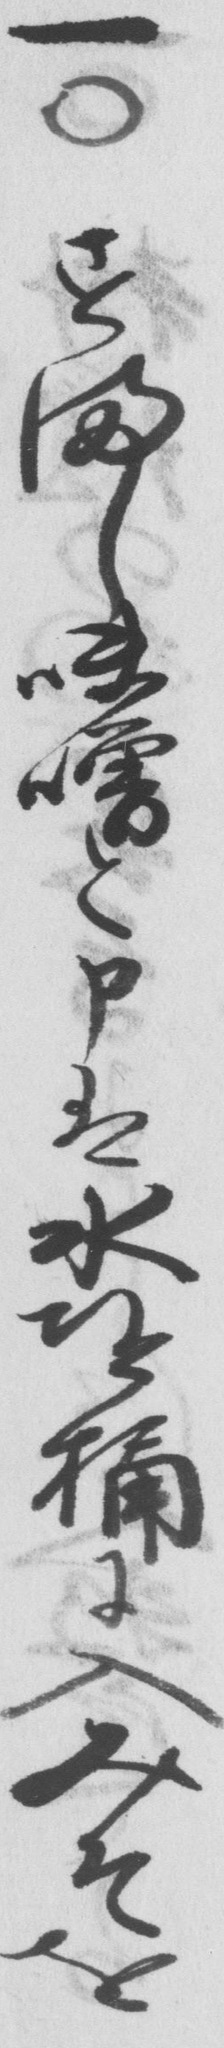一○すまし味噌と申は水を桶に入みそを
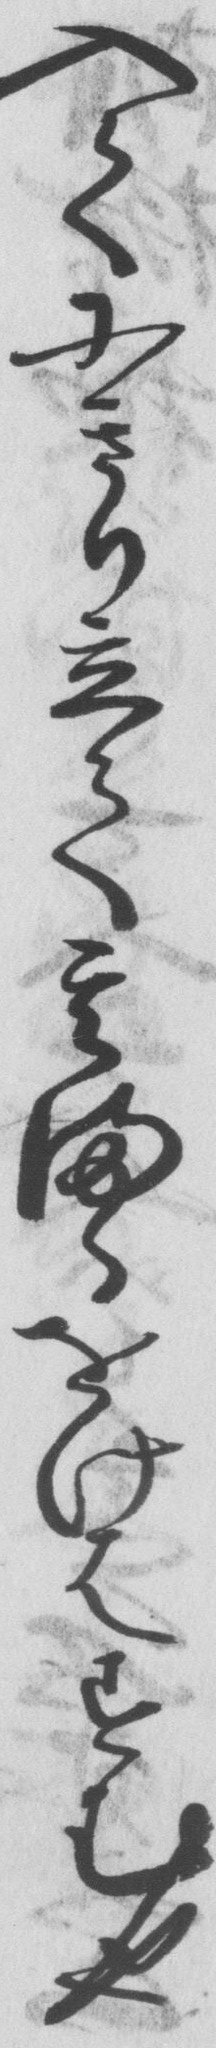入てにきり立て其まゝをけはすむ也
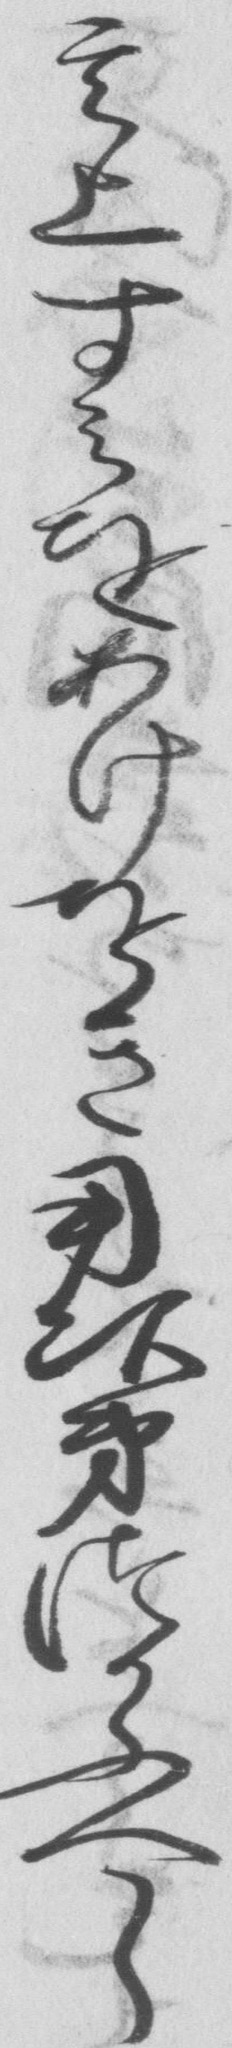其上すみをあけをき用次第つかふへし
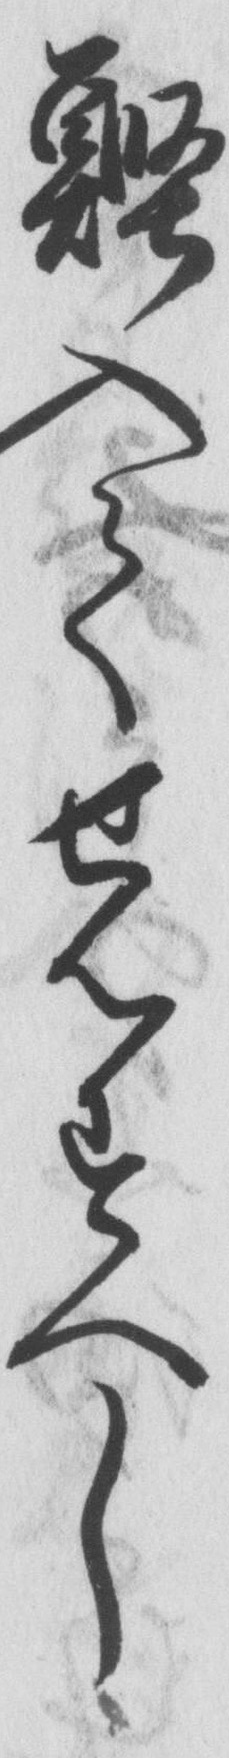鰹入てせんすへし
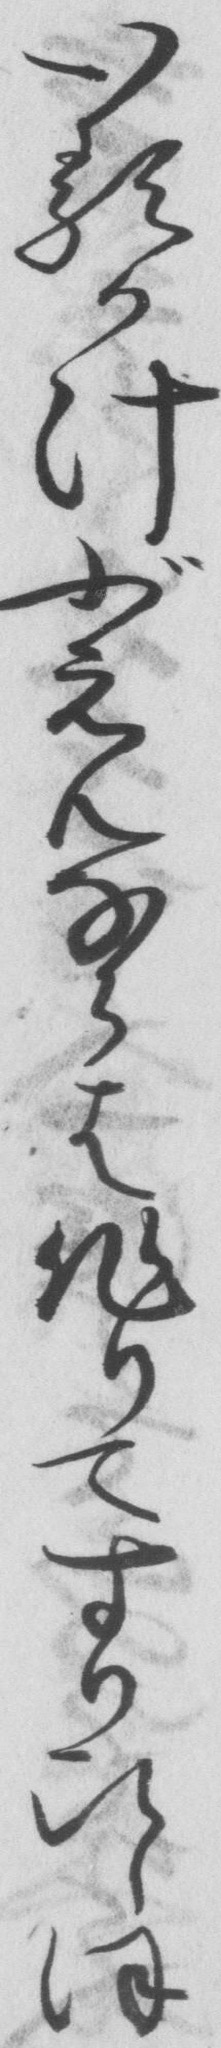一○いるか汁ぶえんならは作りてすりひしほ
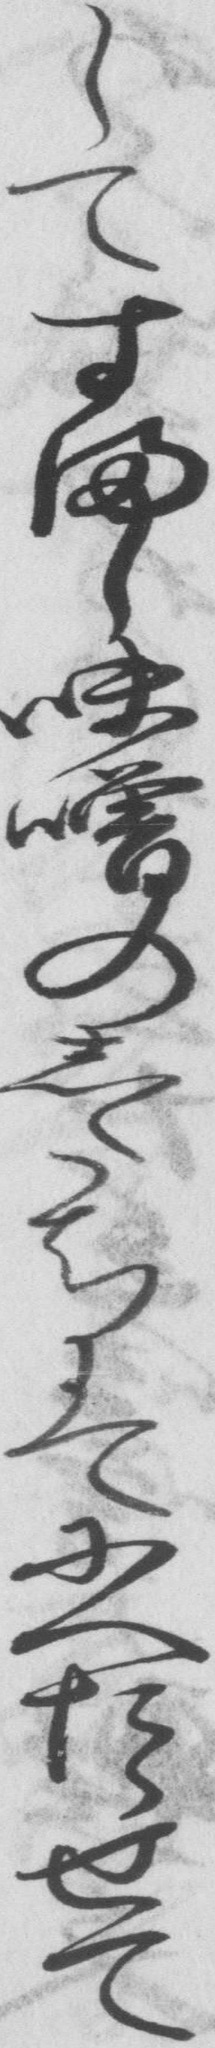してすまし味噌のしたちにてにへたゝせて
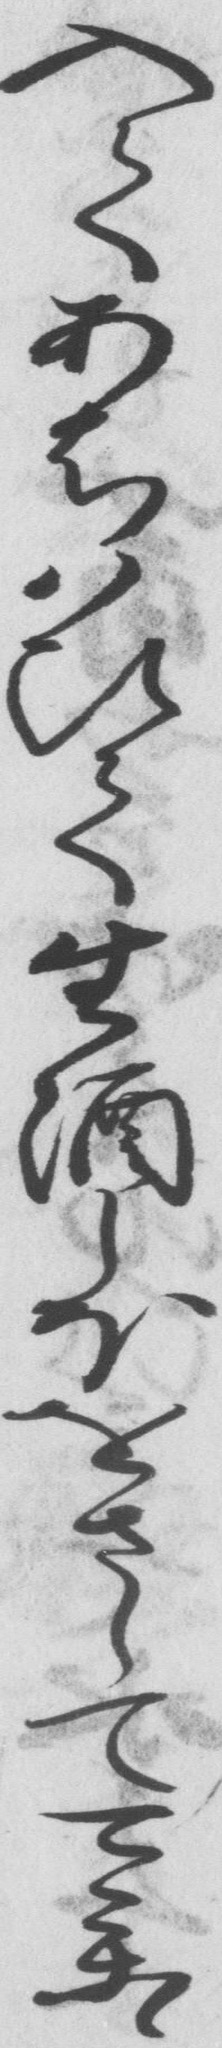入てあちはひて生酒しほをさして可参候
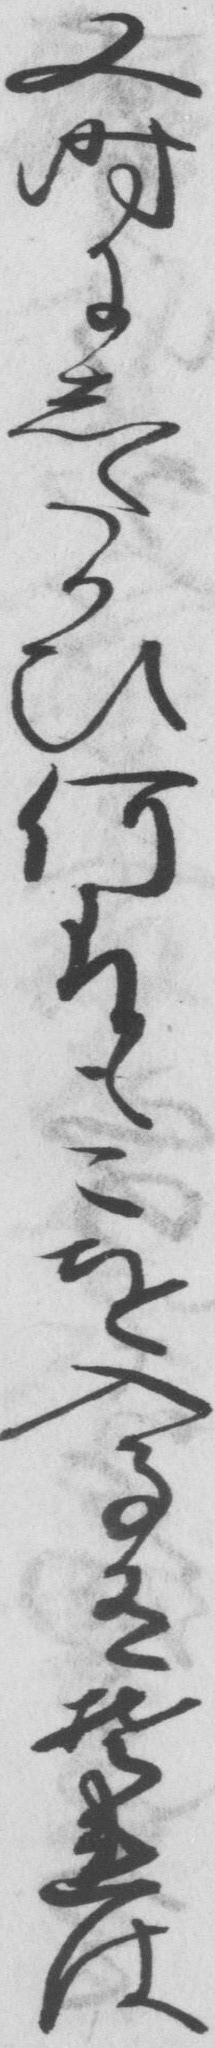又時にしたかひ何にてもこを入事有それは
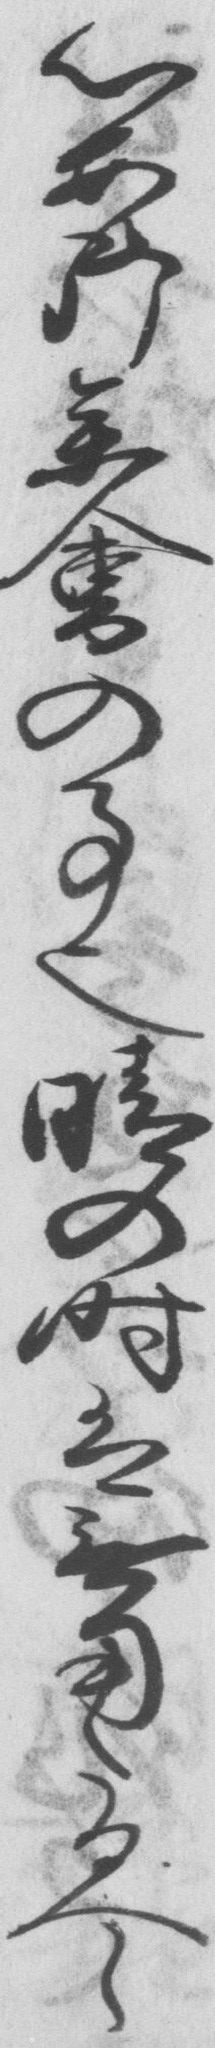心安御参会の事也晴の時は無用たるへし
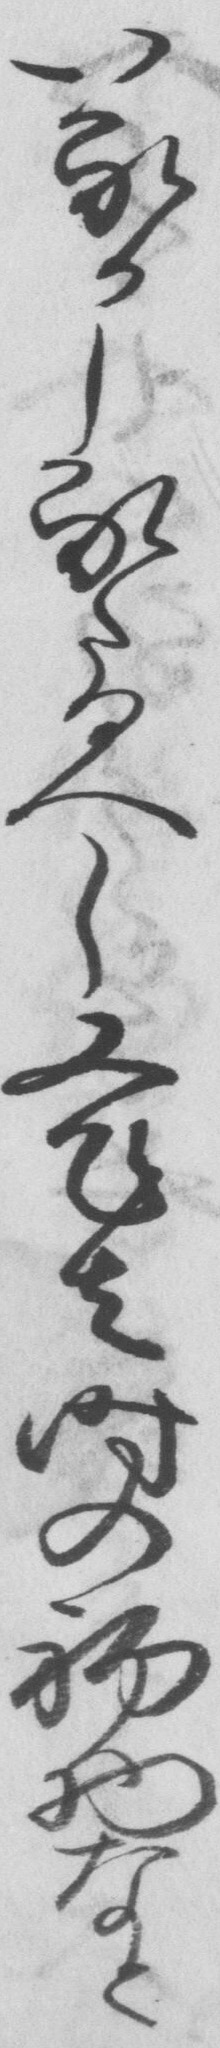いるかしるたるへし又乍去時の初物なと

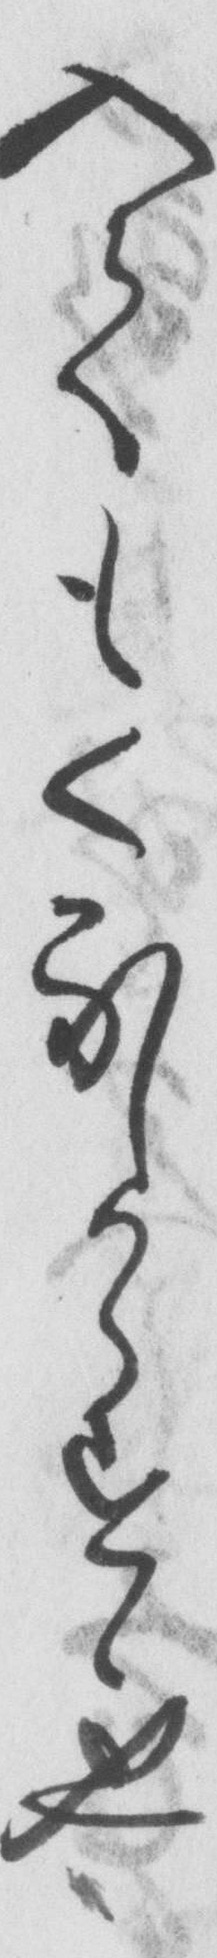入てもくるしからす候也
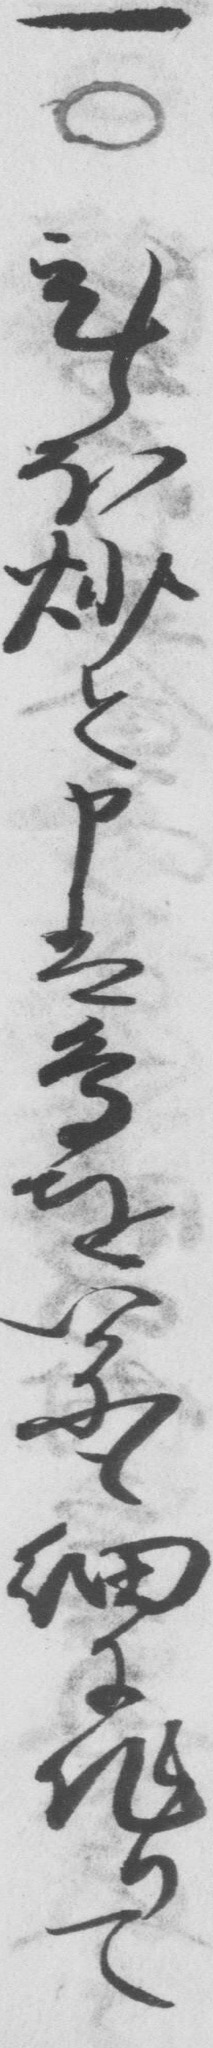一○ひしほ炒と申は鳥をいかにも細に作りて
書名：料理次第
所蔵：大阪府立大学学術情報センター 国文学研究資料館
